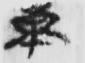東
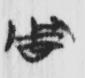周
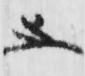之
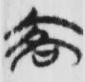客
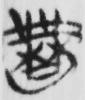○（許）
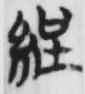○（盈）
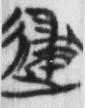歸
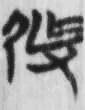{尸拃}（胙）
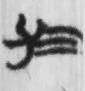於
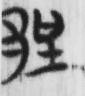郢
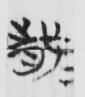歲
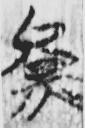○（爨）
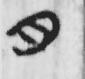月
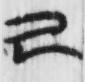己
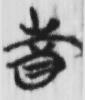梄（酉）
